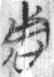周
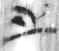之
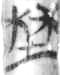埜（野）
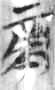帝
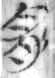{胃刀}（謂）
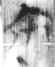尔
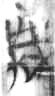無
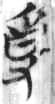事
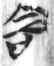命
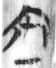尔
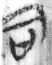司
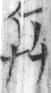兵
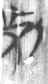死
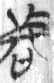者
